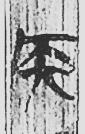侯
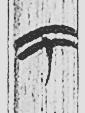于
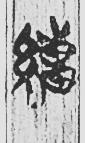{糸東田}
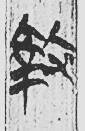{幸攴}
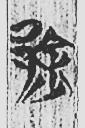{邑余}
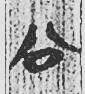公
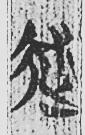述
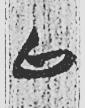㠯（以）
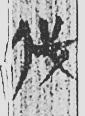伐
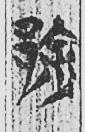{邑余}
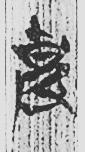尅
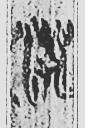澫
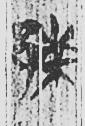邾
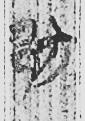邡
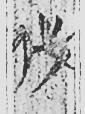伐
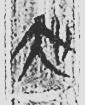吳
